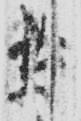於
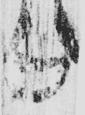公
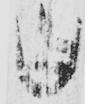曰
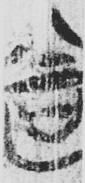甚
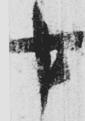才（哉）
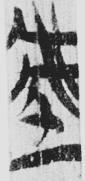○（吾）
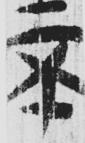不
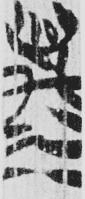澫（賴）
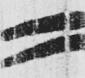二
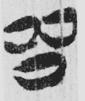厽（三）
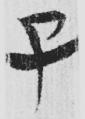子
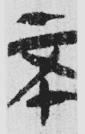不
